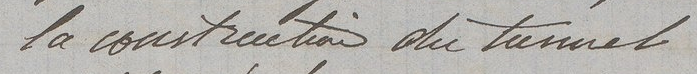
la construction du tunnel
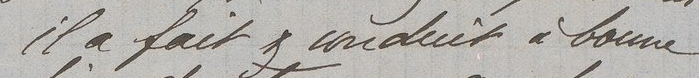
il a fait & conduit à bonne
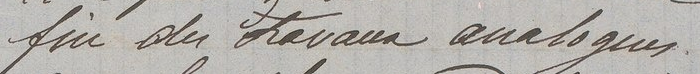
fin des travaux analogues,
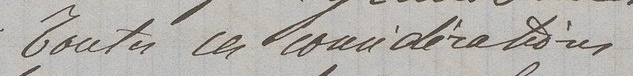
Toutes ces considérations
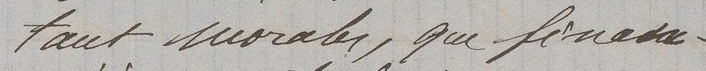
tant morales, que finan-
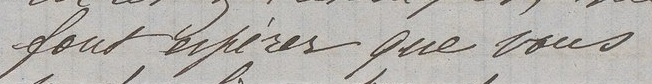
font espérer que vous
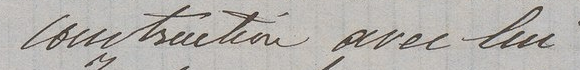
construction avec lui.
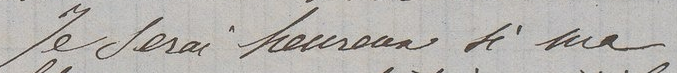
Je serai heureux si ma
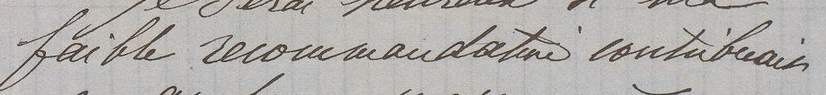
faible recommandation contribuait
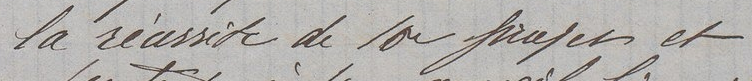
la réussite de son projet et
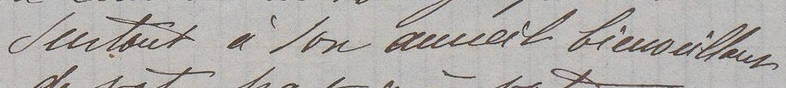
surtout à son accueil bienveillant
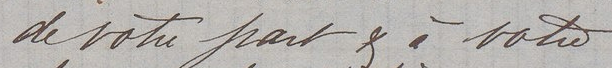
de votre part & à votre
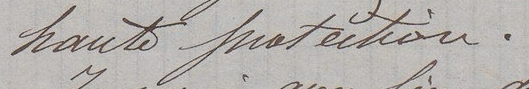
haute protection.
